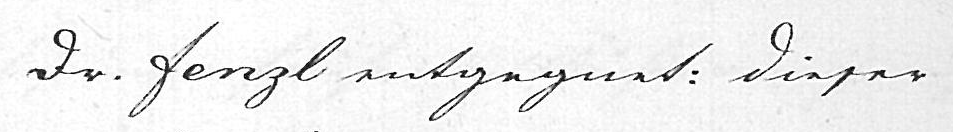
Dr. Fenzl entgegnet: Dieser
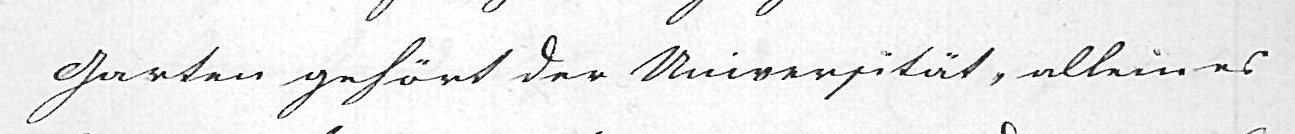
Garten gehört der Universität, allein es
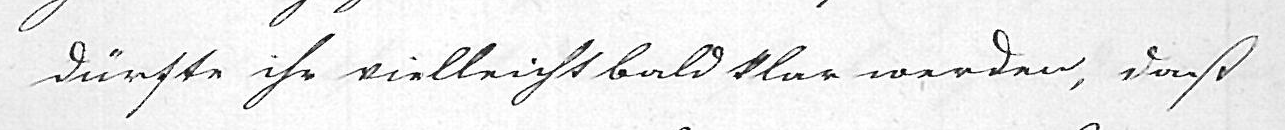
dürfte ihr vielleicht bald klar werden, daß
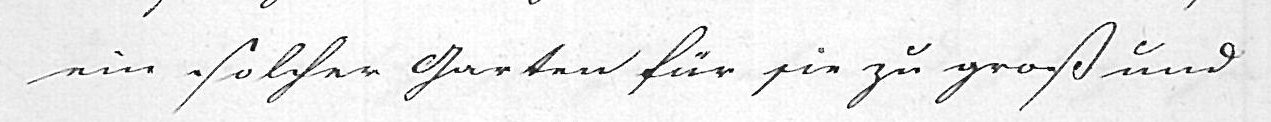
ein solcher Garten für sie zu groß und
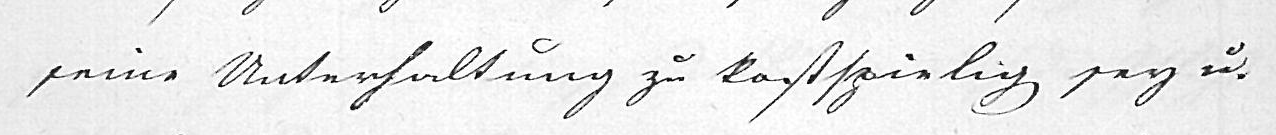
seine Unterhltung zu kostspielig sey u.
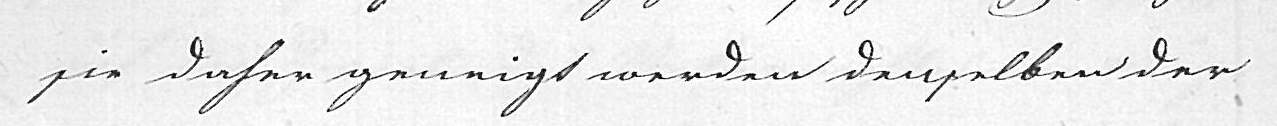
sie daher geneigt werden denselben der
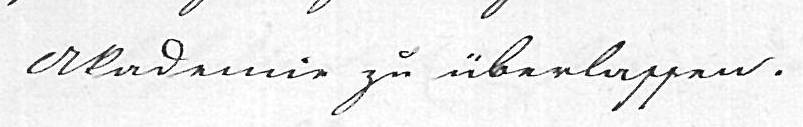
Akademie zu überlassen.
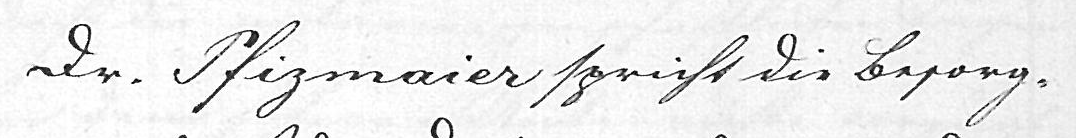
Dr. Pfizmaier spricht die Besorg-
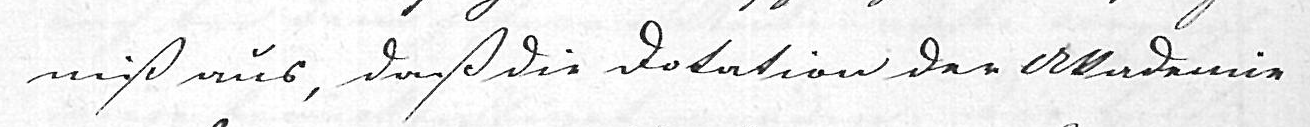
niß aus, daß die Dotation der Akademie
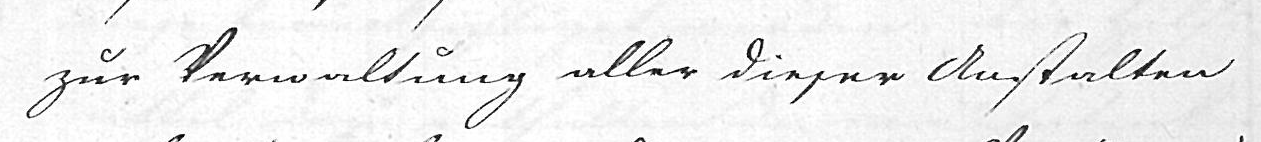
zur Verwaltung aller dieser Anstalten
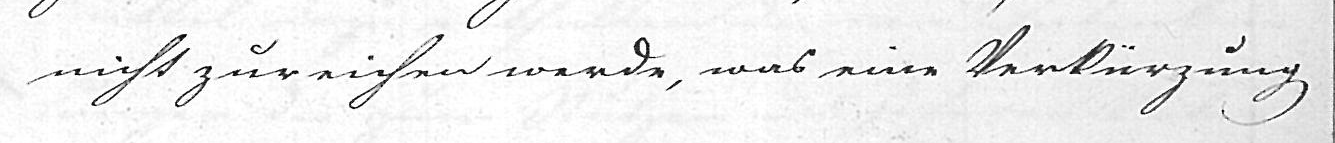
nicht zureichen werde, was eine Verkürzung
